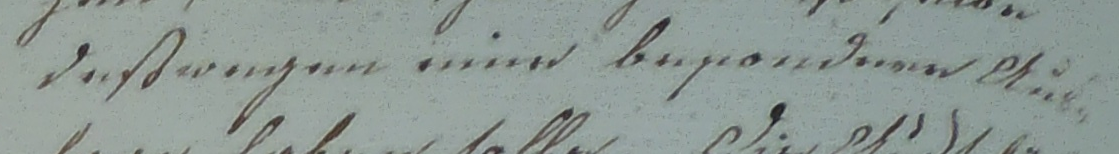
deßwegen eine besondere Aus¬
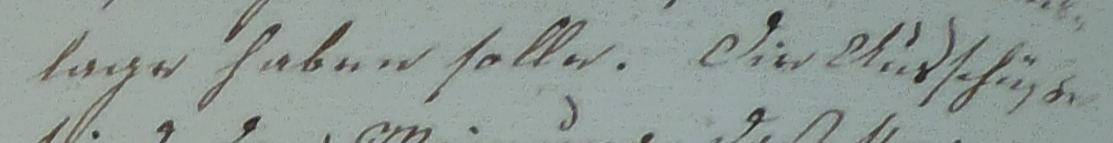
lage haben solle. Die Ausschüsse
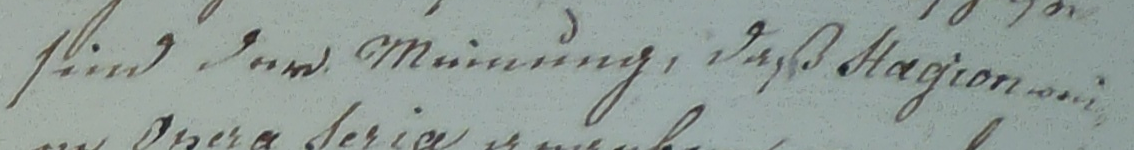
sind der Meinung, daß Stagionwei¬
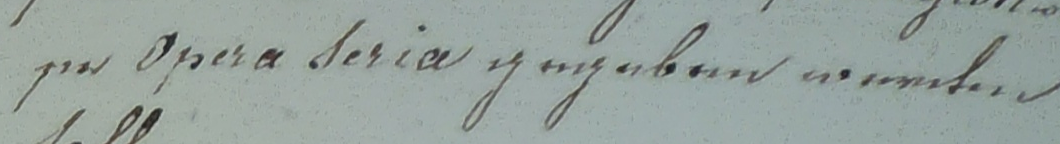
se Opera Seria gegeben werden
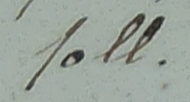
soll.
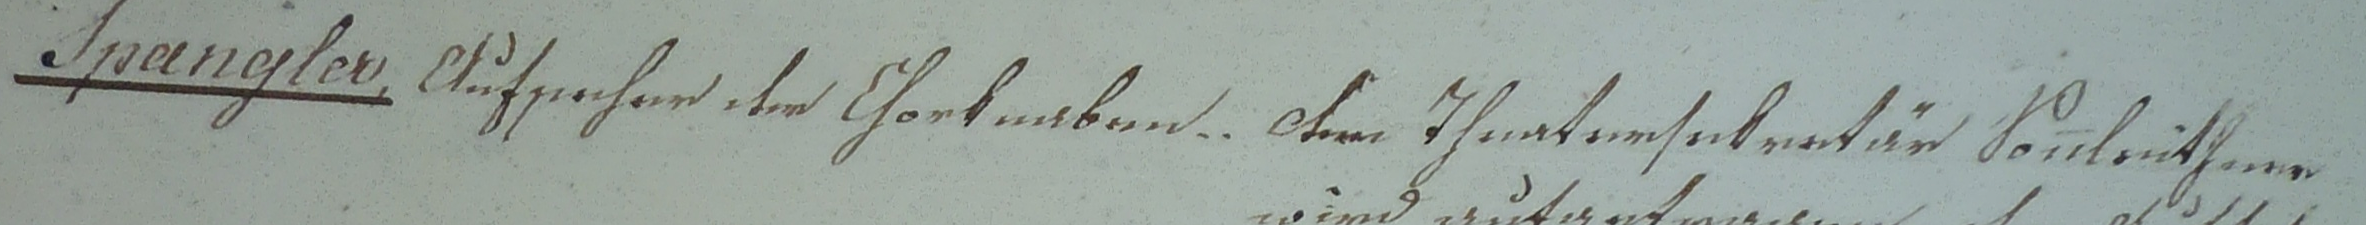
Spangler, Aufseher der Chorknaben .. Dem Theatersekretär Son̅leithner
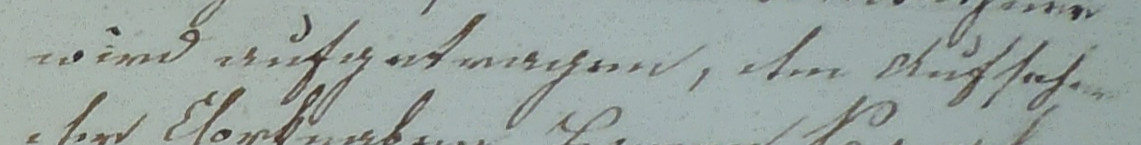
wird aufgetragen, den Aufseher
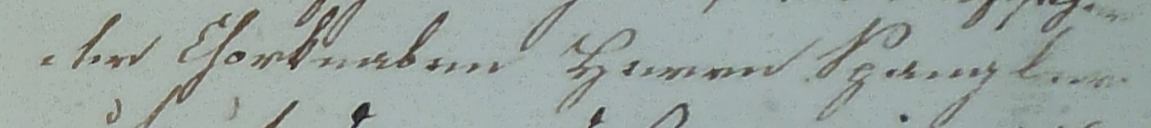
der Chorknaben Herrn Spangler
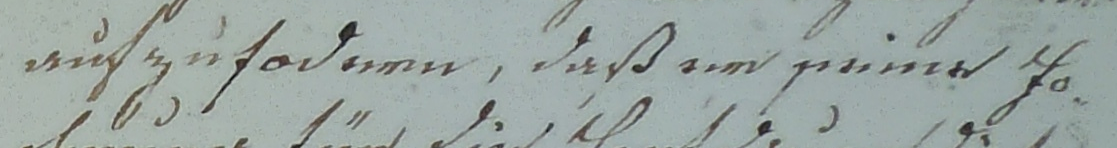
aufzufordern, daß er seine Fo¬
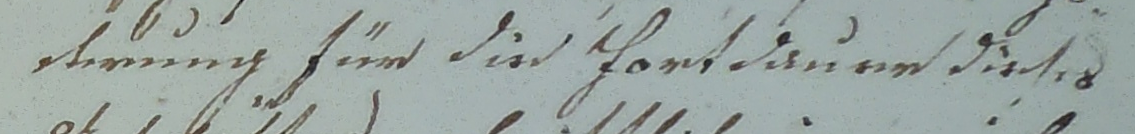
derung für die Fortdauer dieses
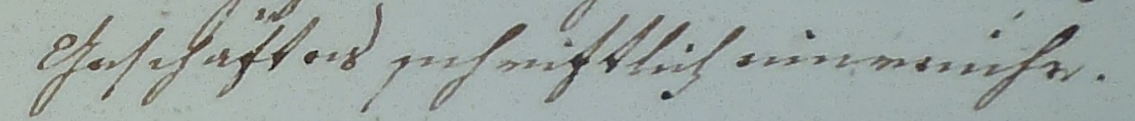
Geschäftes schriftlich einreiche.
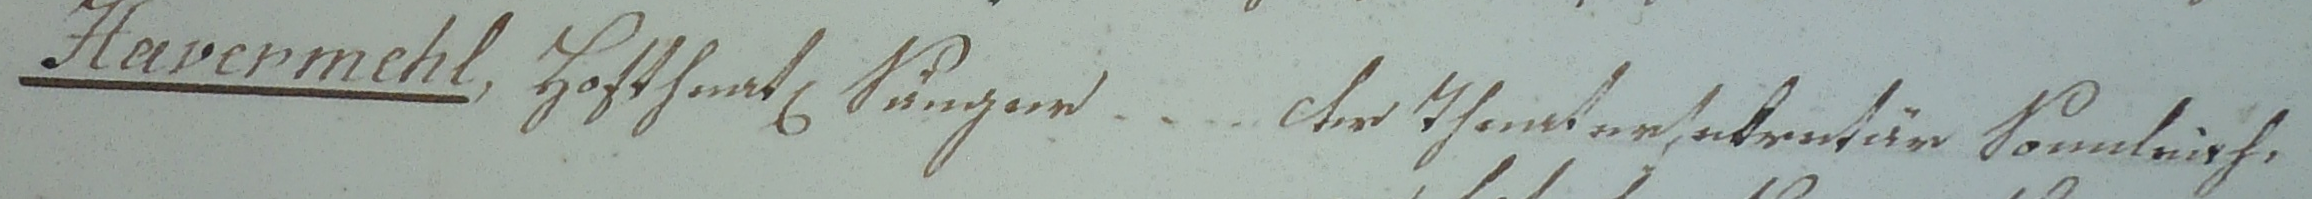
Havermehl, HoftheatE Sänger ….. Der Theatersekretär Sonnleith¬
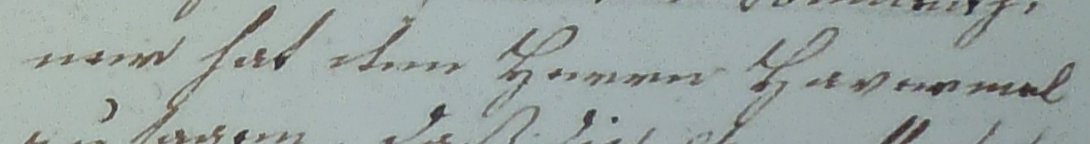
ner hat dem Herrn Havermel
